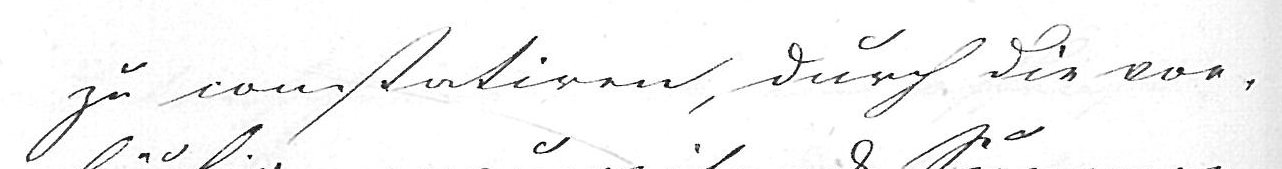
zu constatiren, durch die vor-
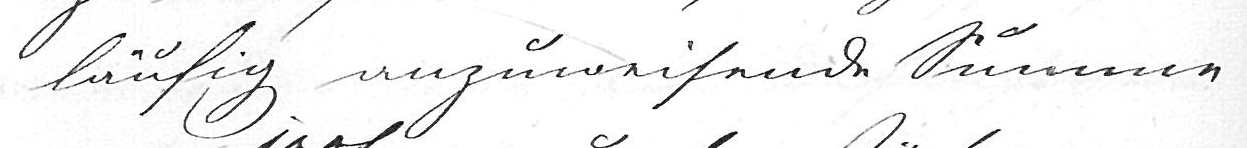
läufig anzuweisende Summe
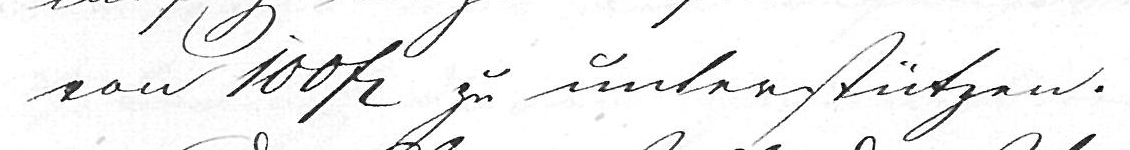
von 100 fl zu unterstützen.
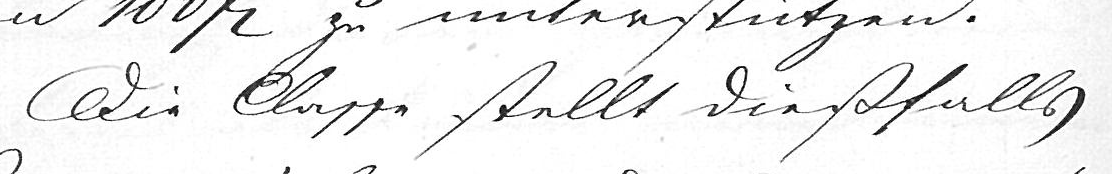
Die Classe stellt dießfalls
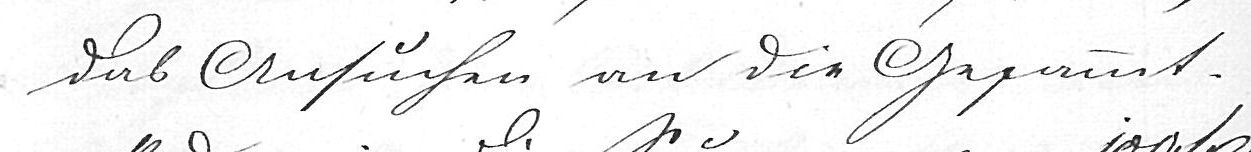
das Ansuchen an die Gesammt-
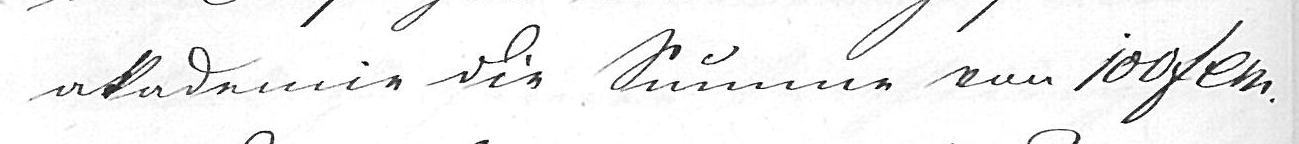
akademie die Summe von 100 fl CM.
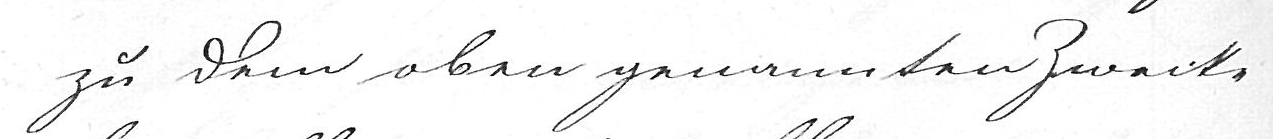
zu dem oben genannten Zwecke
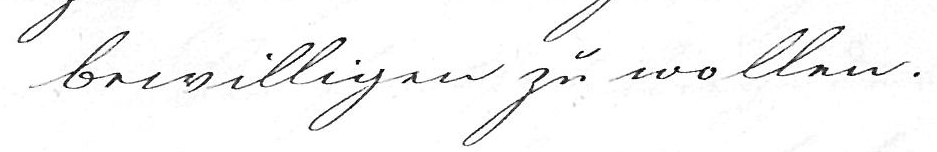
bewilligen zu wollen.
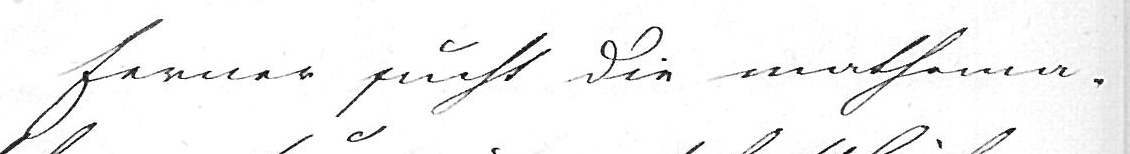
Ferner sucht die mathema-
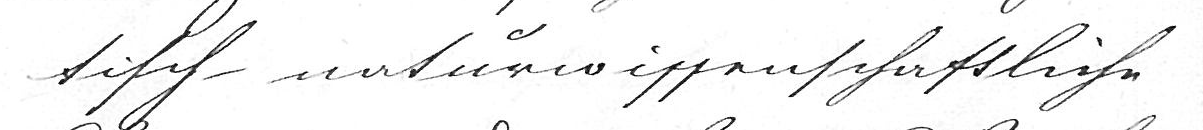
tis-naturwissenschaftliche
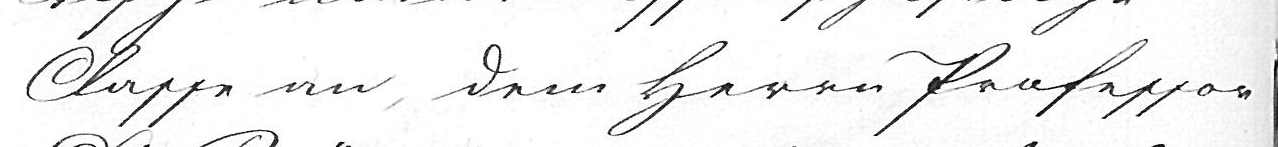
Classe an, dem Herrn Professor
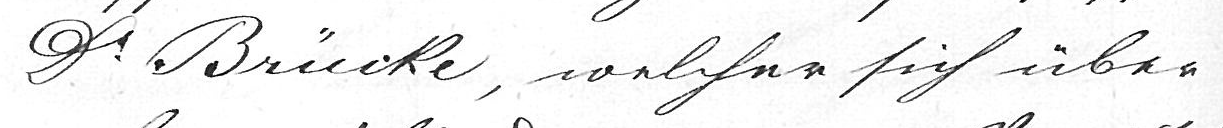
Dr Brücke, welcher sich über
